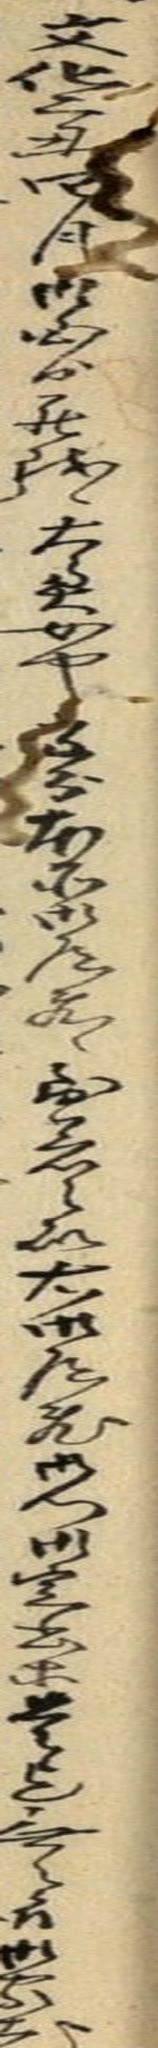一文化二丑四月御国ゟ罷越候大奥女中当分本所御屋敷へ到着之処右御屋敷御門御定書等是迄無之候付御家老
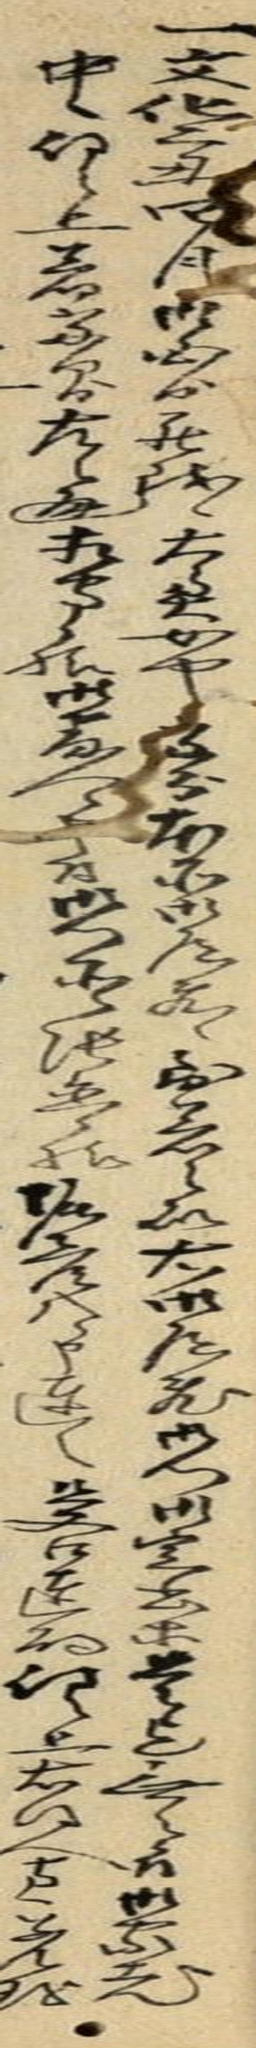中へ伺之上着当日ゟ左之通相守候様御番人へ申付御門所へ張置候様堀彦八へ申達之且又口達触伺之上右同人方へ差越
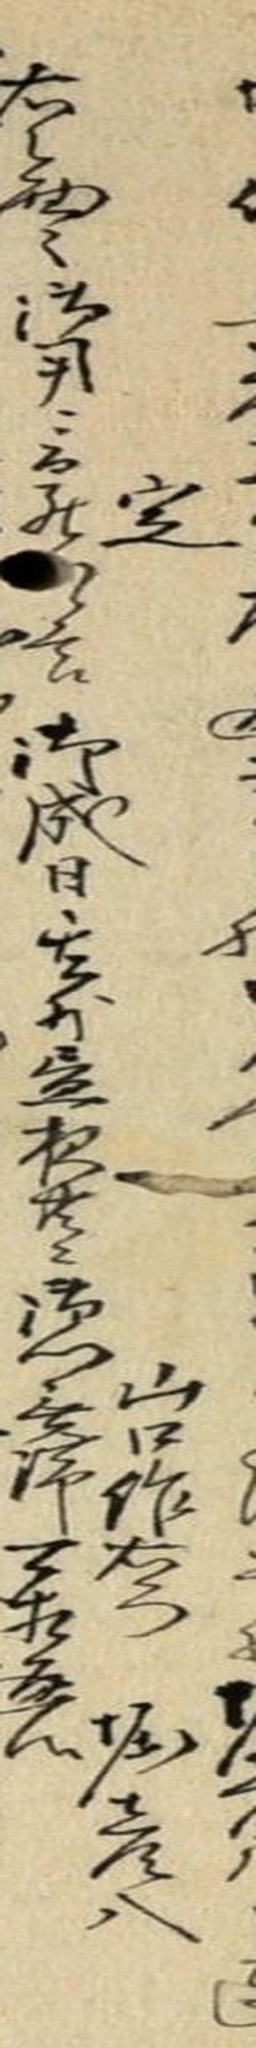右之面々御用にて罷出候節御成日其外昼夜共に御門無滞可相通候
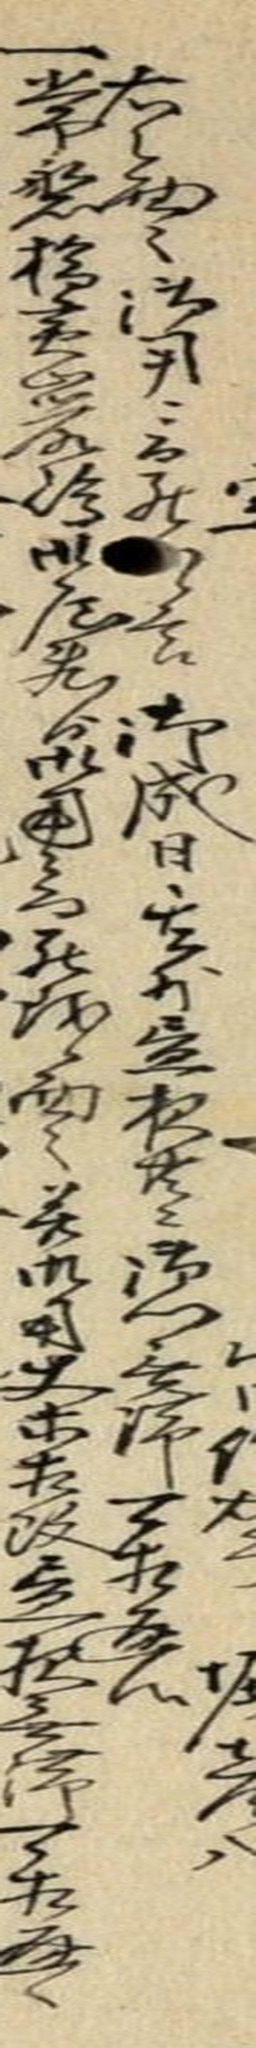一常盤橋霊巖嶋御屋敷ゟ御用にて罷越候面々幷御用使等相改昼夜無滞可相通候
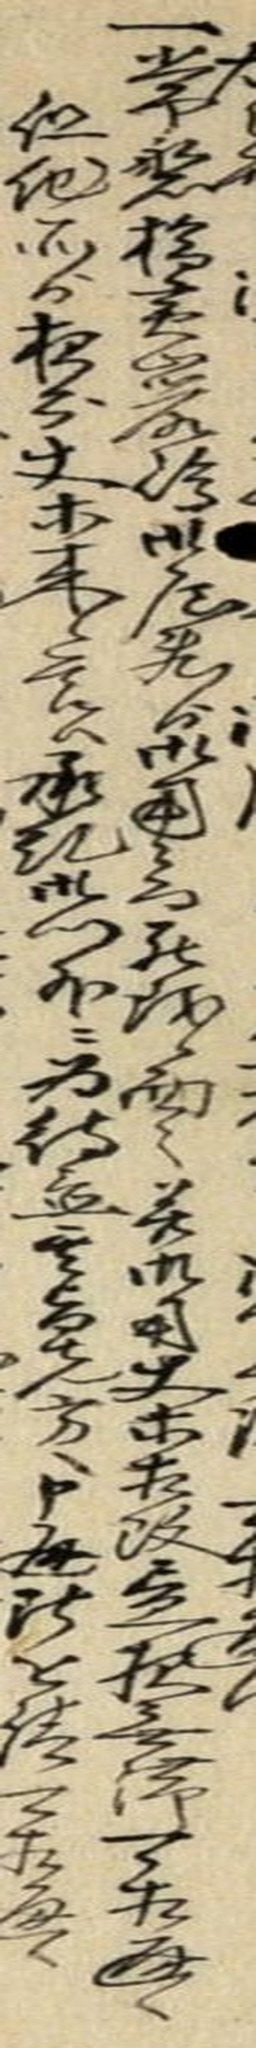但他所ゟ夜分使等来候節は承糺御門外に為待置其旨先方へ申通断を請可相通候
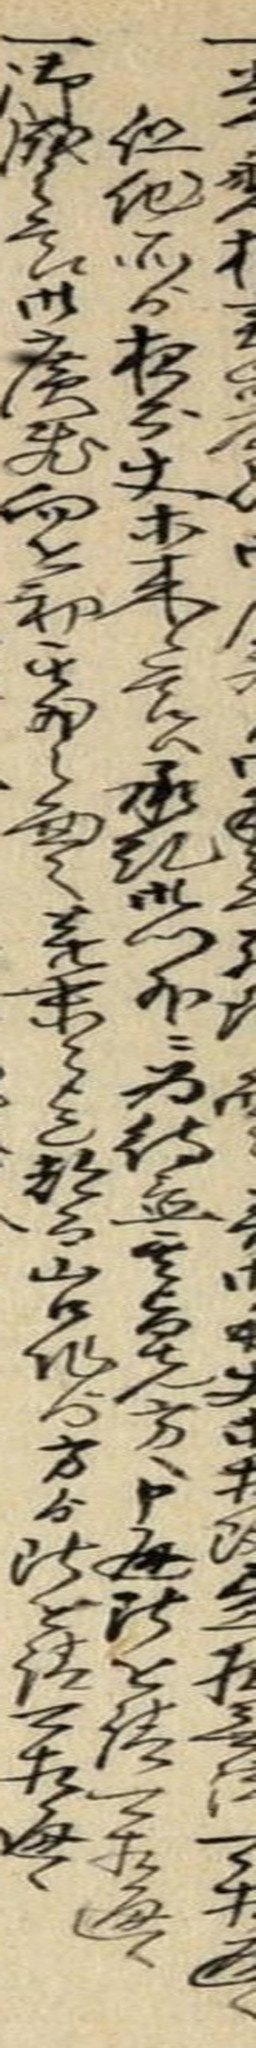一御成之節御広敷向を初其外之面々幷末々迄都而山口作右衛門方ゟ断を請可相通候
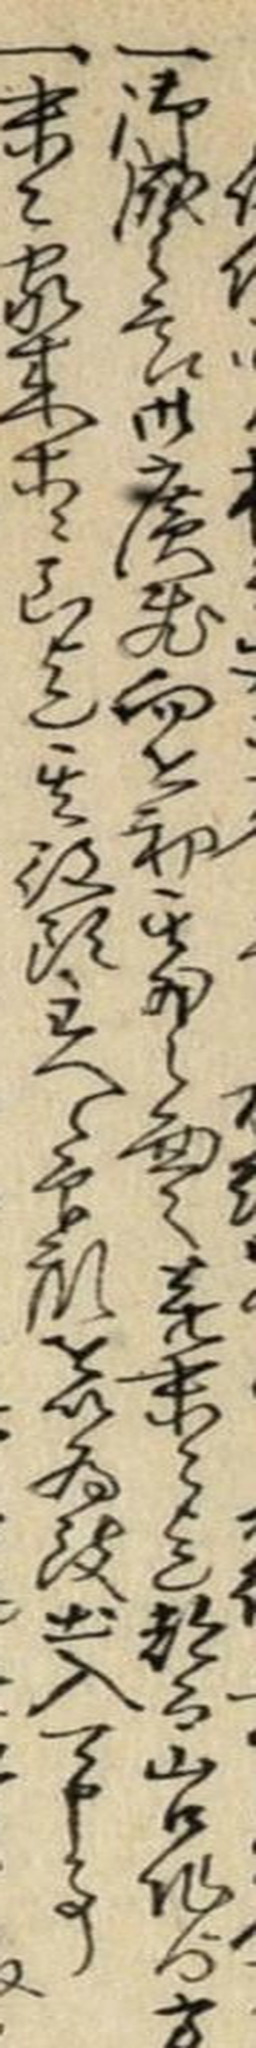一末々家来等に至迄其役頭主人之印形を以為致出入可申事
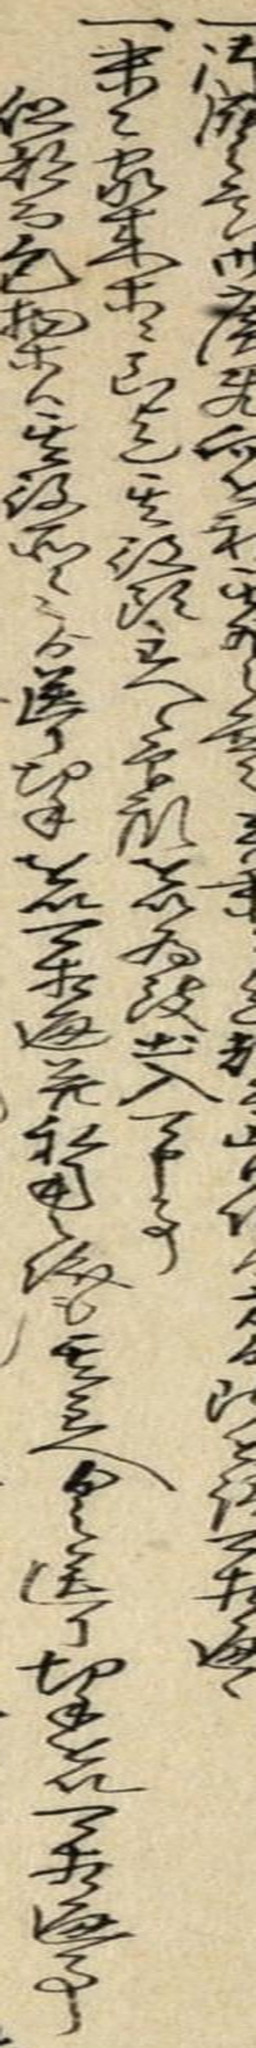但都而包物等は其役所々々ゟ送り切手を以可相通幷私用之儀も其主人ゟ之送り切手を以可相通事
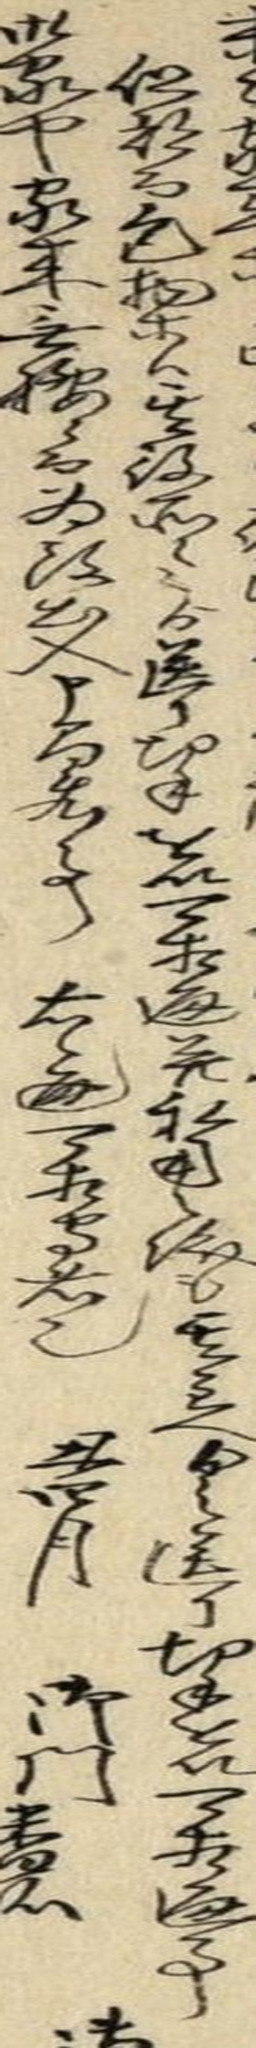一御家中家来無腰にて為致出入申間敷事右之通可相守者也丑四月御門番所御目付
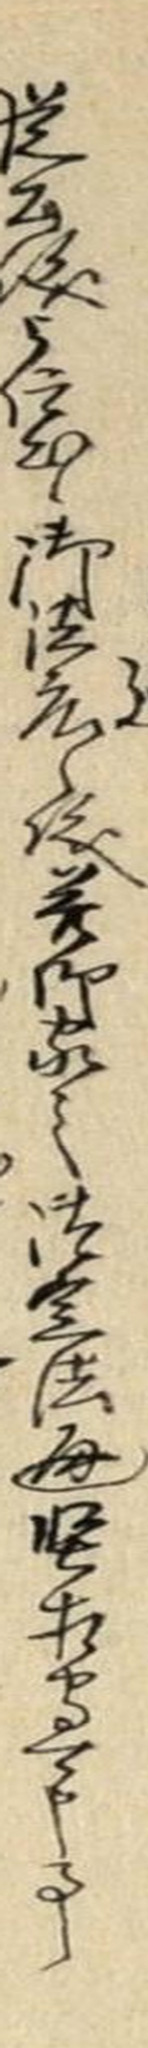従公儀被仰出候御法度之儀幷御家之御定法通堅相守可申事
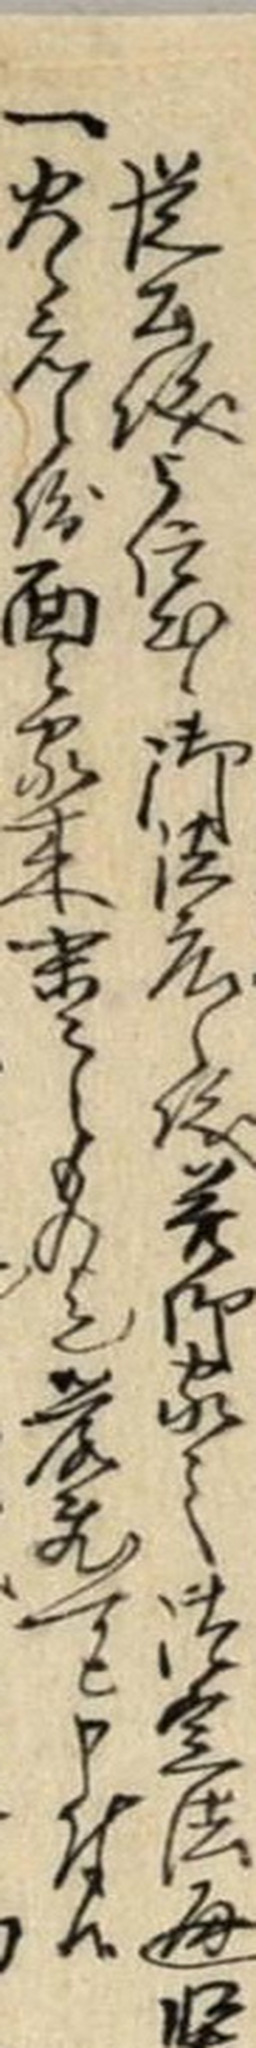一火の元之儀面々家来末々のもの迄厳敷可被申付候
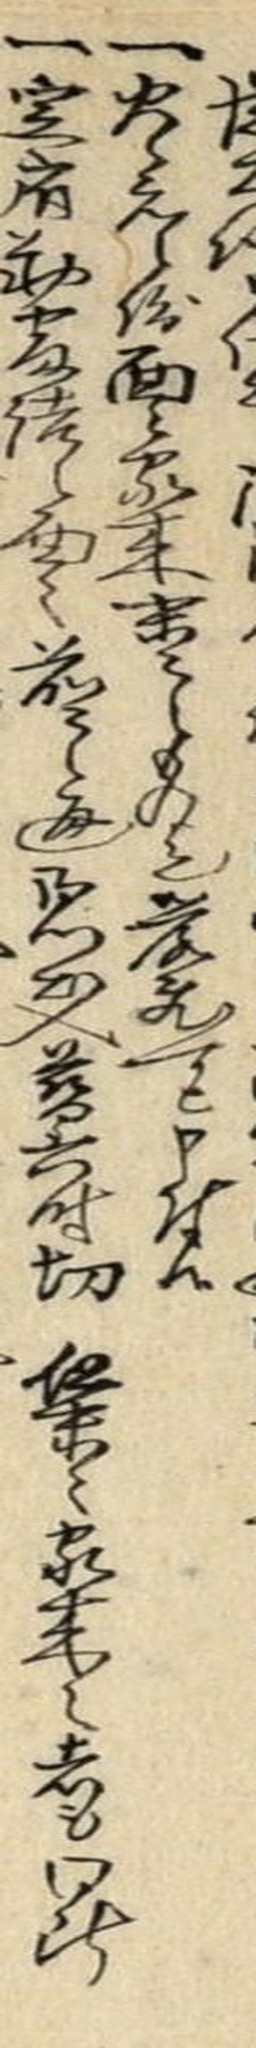一定府勤番詰之面々前々之通御門出入暮六時切但末々家来之者も同断
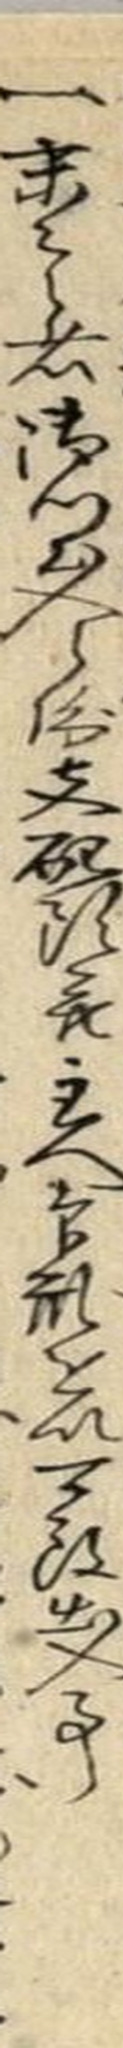一末々之者御門出入之儀支配頭幷主人印形を以可致出入事
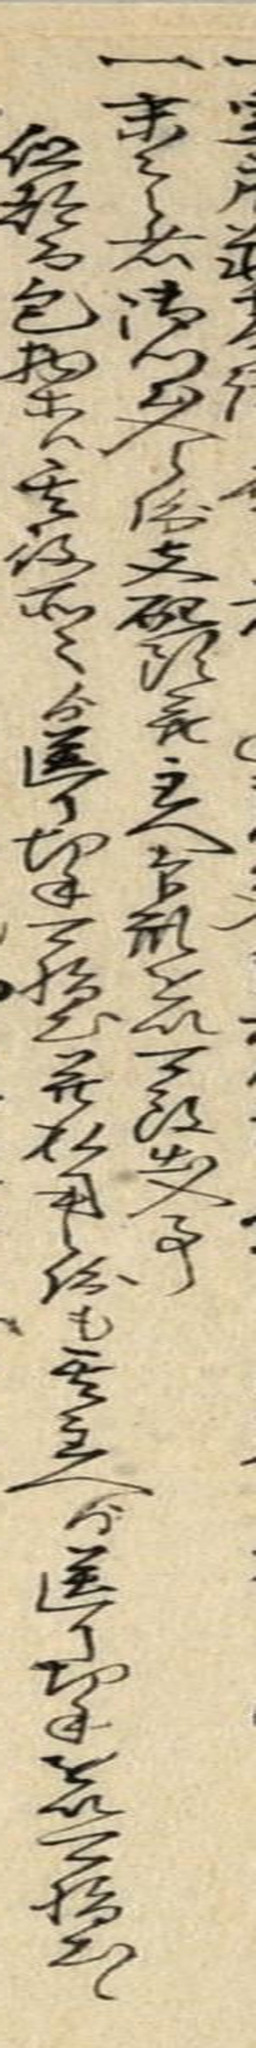但都而包物等は其役所々ゟ送り切手可指出幷私用之儀も其主人ゟ送り切手を以可指出候
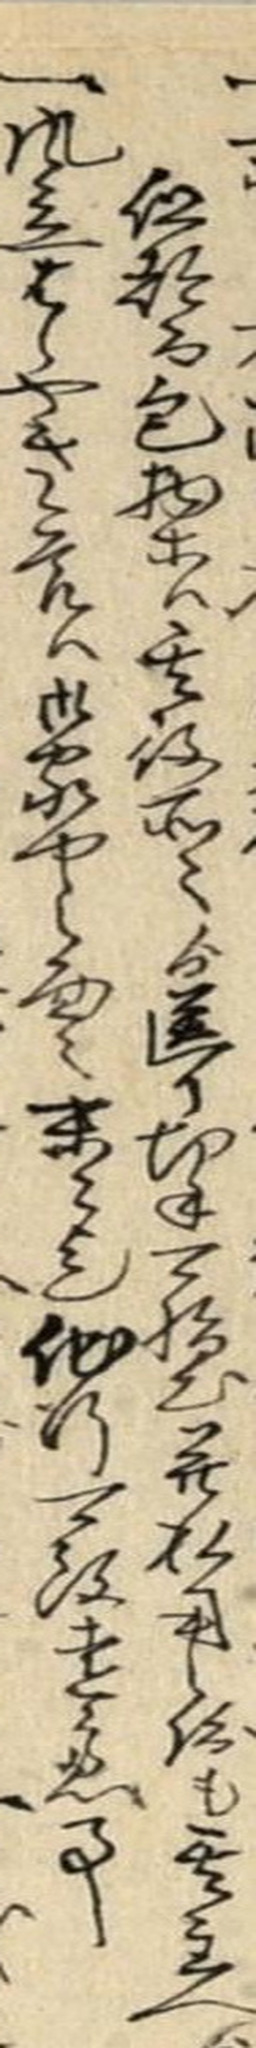一風立はしやき候節は御家中之面々末々迄他行可致遠慮事
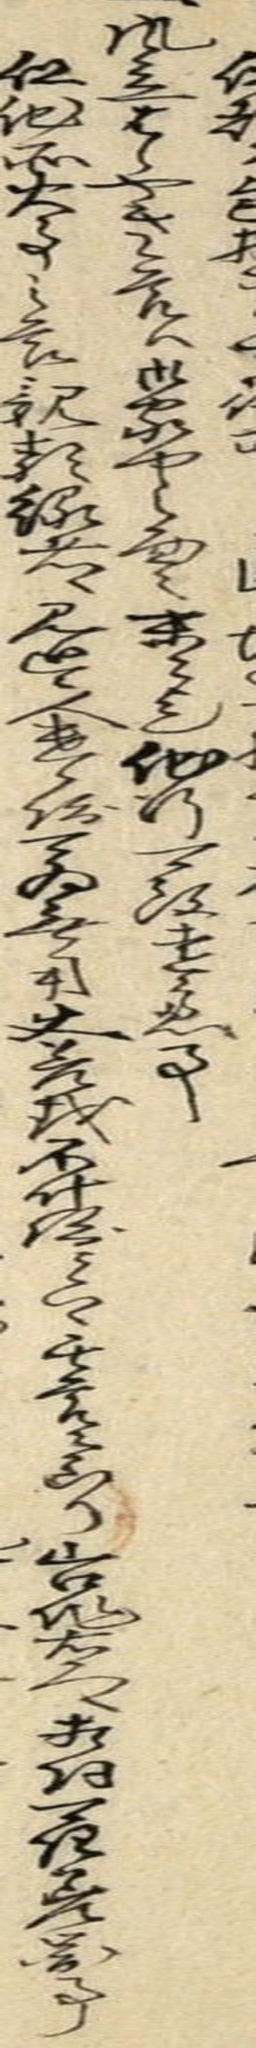但他所火事之節親類縁者へ見廻候人遣候儀可為無用使差越不叶儀に候はゝ其節に至り山口作右衛門へ相伺可任指図事
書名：三都并道中之部
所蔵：福井県文書館 Fukui Prefectural Archives
